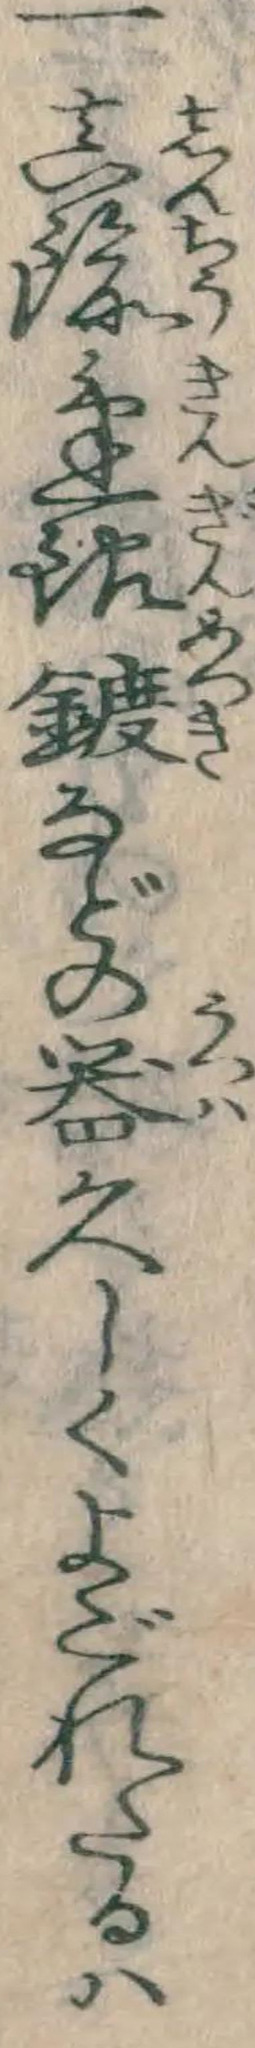一真鍮金銀鍍などの器久しくよごれたるは

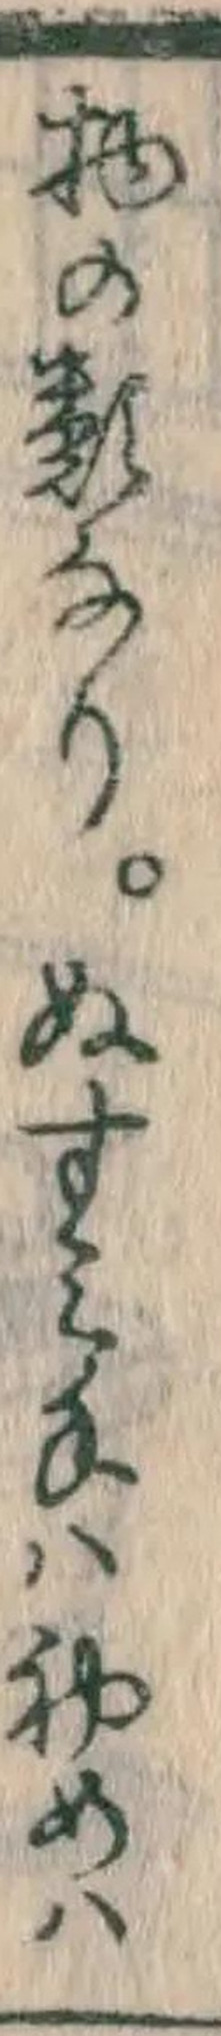物の類なり。ぬすみ手は初めは
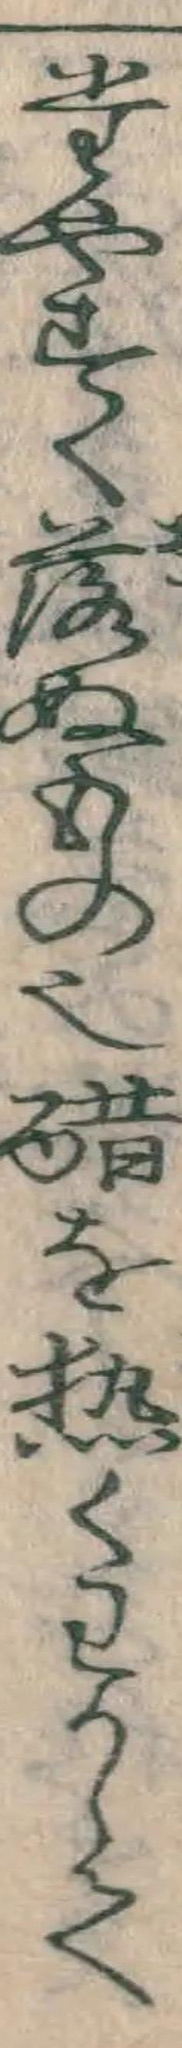たやすく落ぬもの也醋を熱くわかして
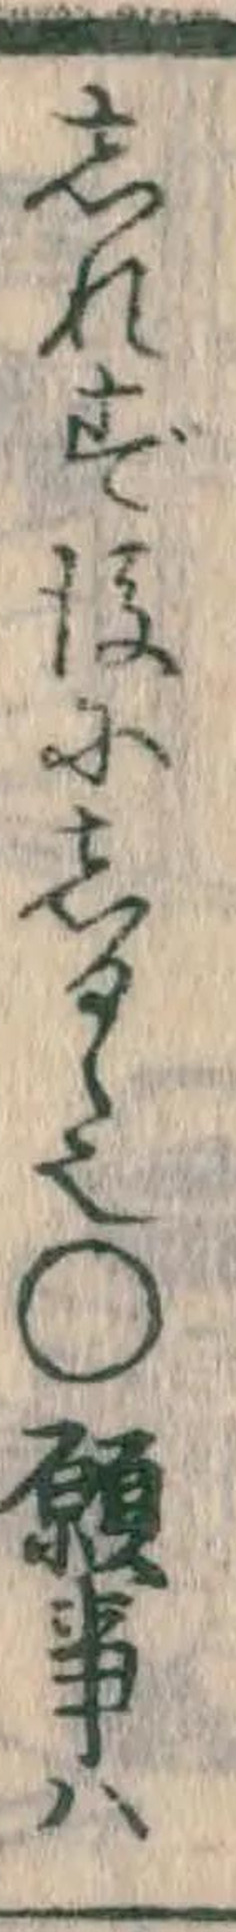しれず後にしるゝ也○願事は
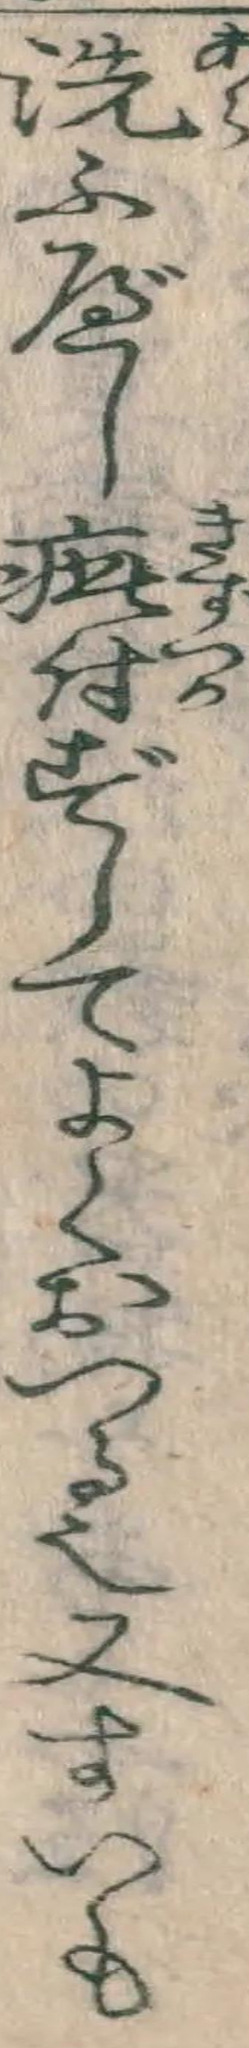洗ふべし疵付ずしてよくおつる也又すいも
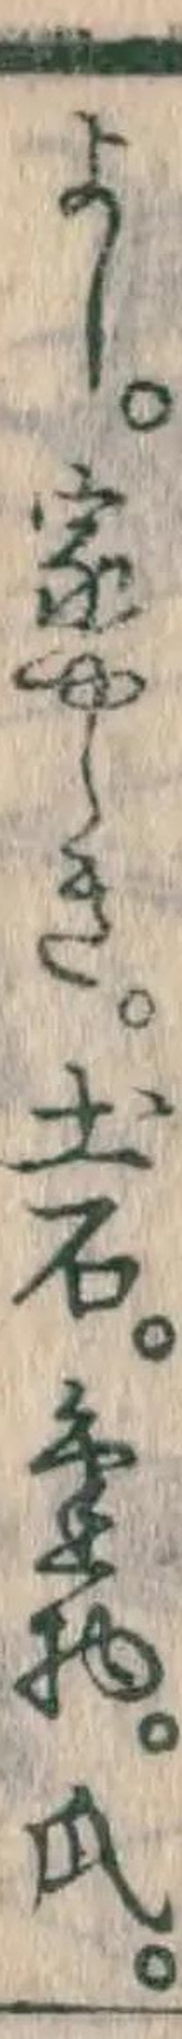よし。家やしき。土石。金物。瓜。
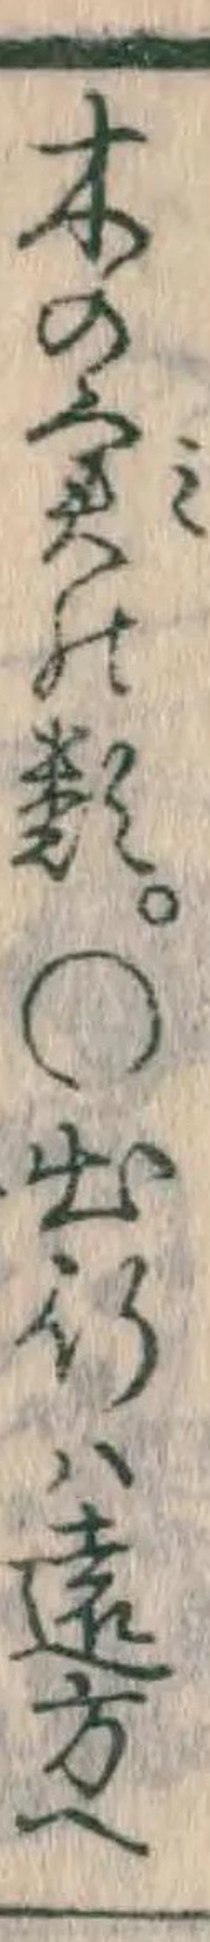木の実の類。○出行は遠方へ
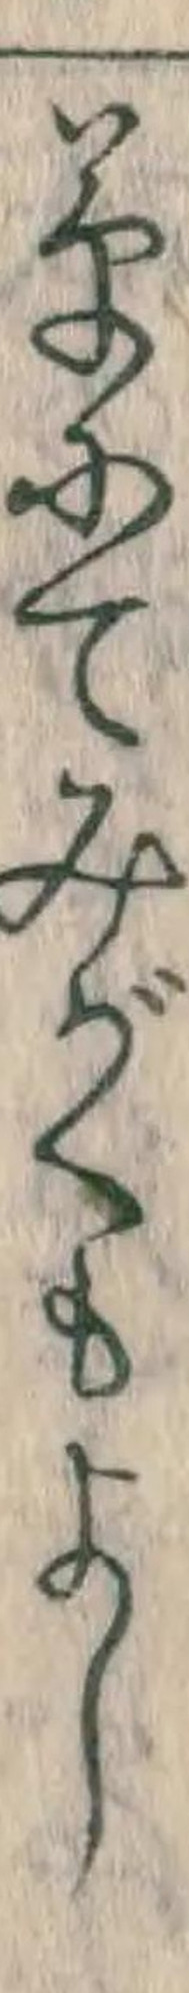草にてみがくもよし
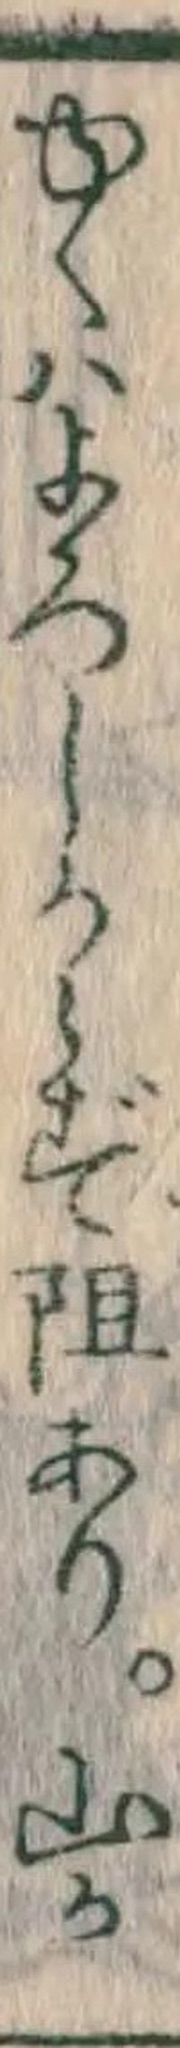ゆくはよろしからず阻あり。山か
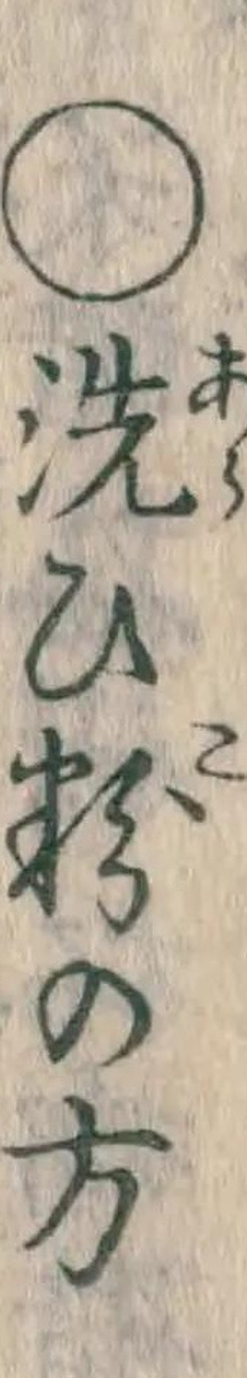○洗ひ粉の方
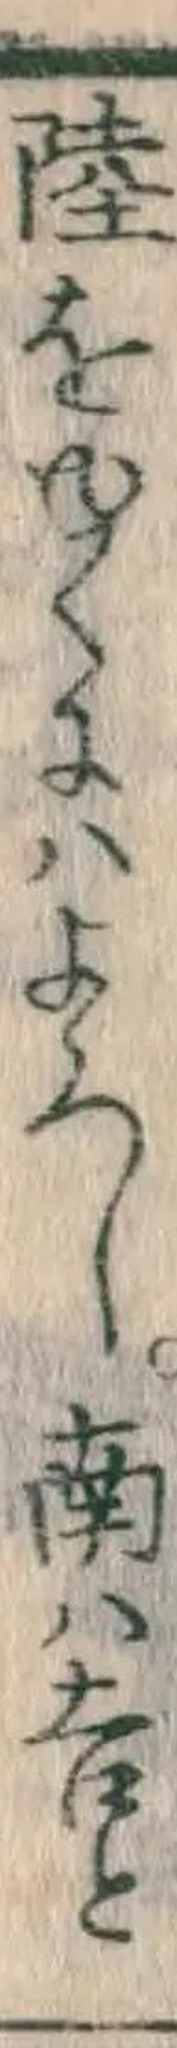陸をゆくにはよろし。南は吉と
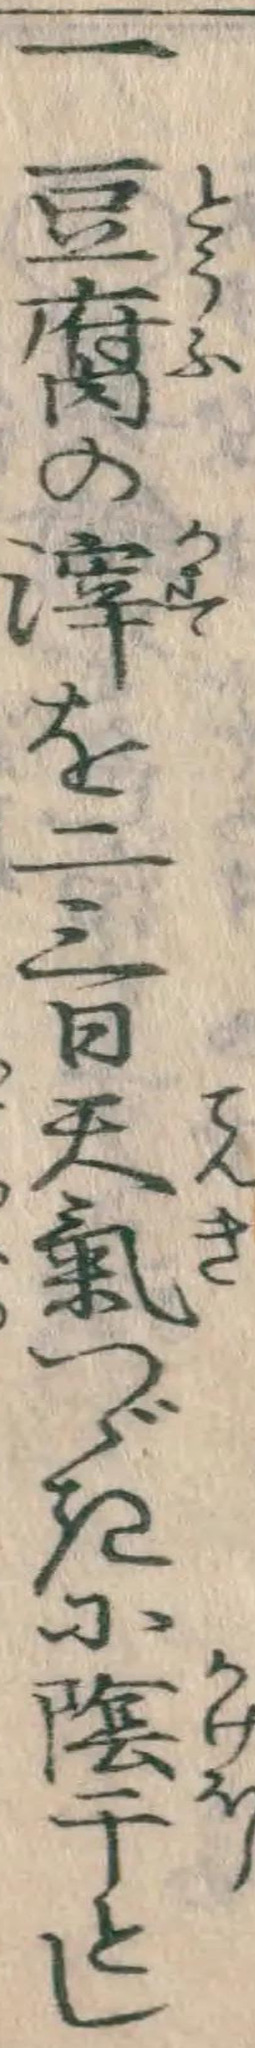一豆腐の滓を二三日天気つゞきに陰干とし
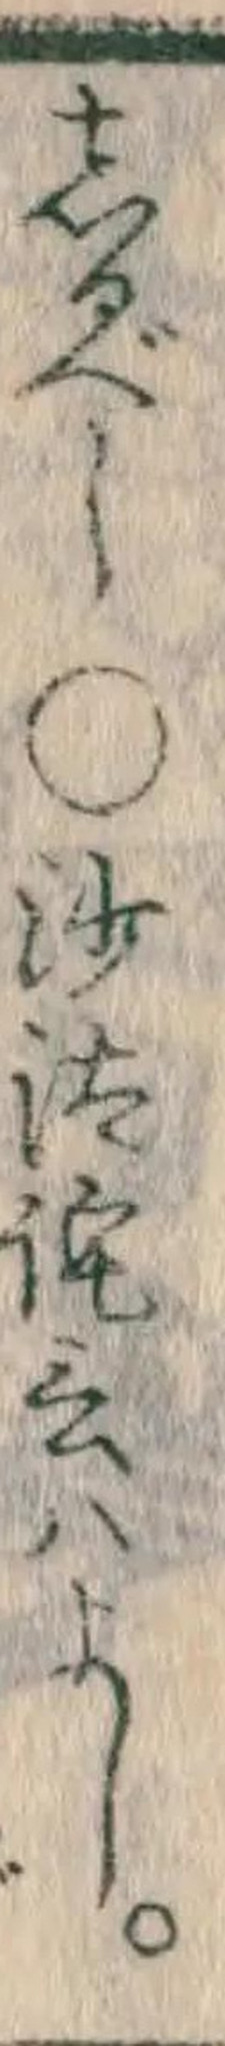しるべし○沙汰詫言はよし。
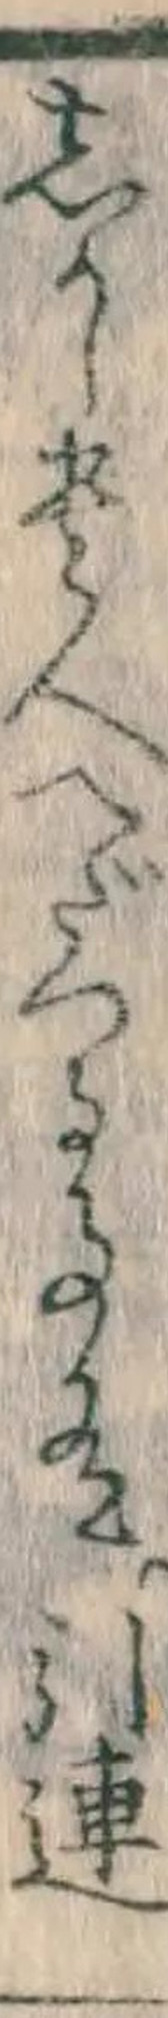しかし貴人へだつる事有。引連
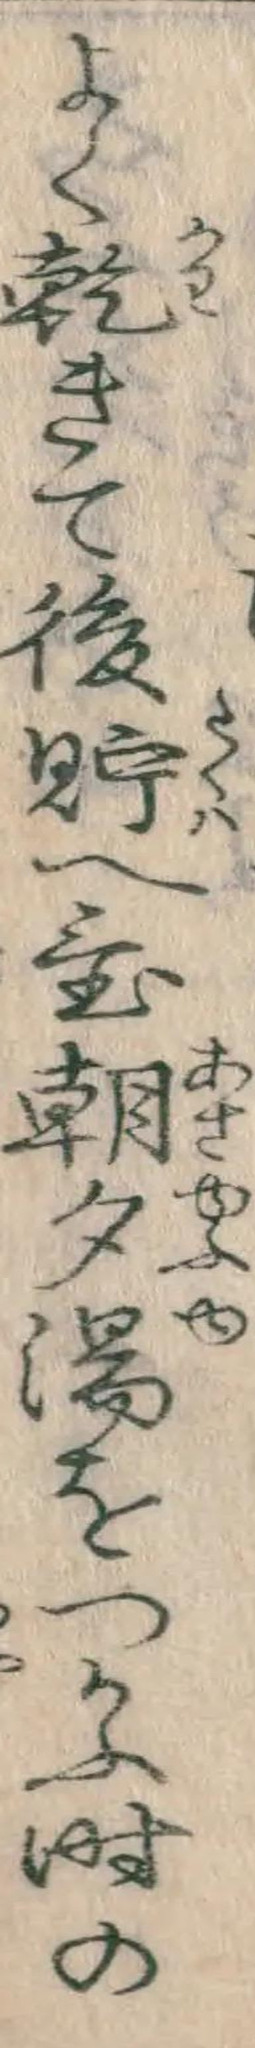よく乾きて後貯へ置朝夕湯をつかふ時の
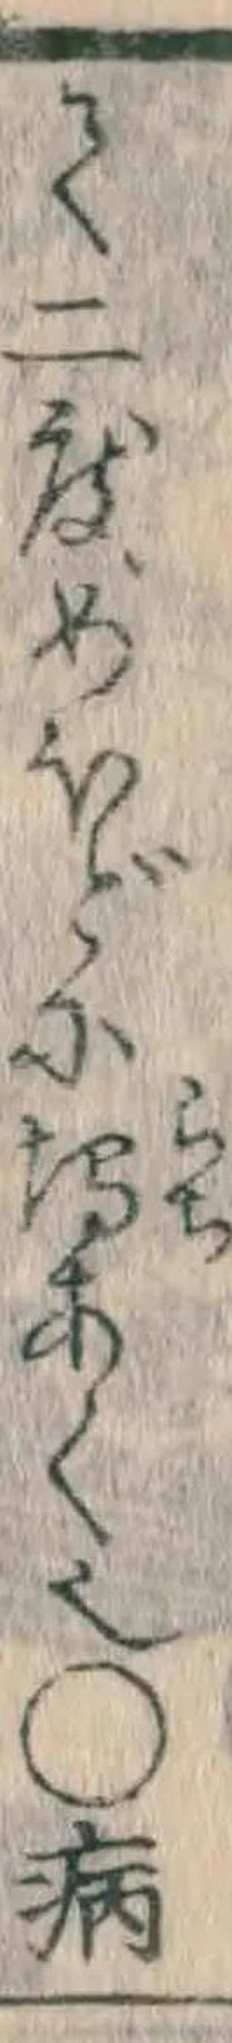て二度めほどに埓あく也○病
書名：広益秘事大全 3巻. [1]
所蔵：国立国会図書館 National Diet Library, JAPAN
